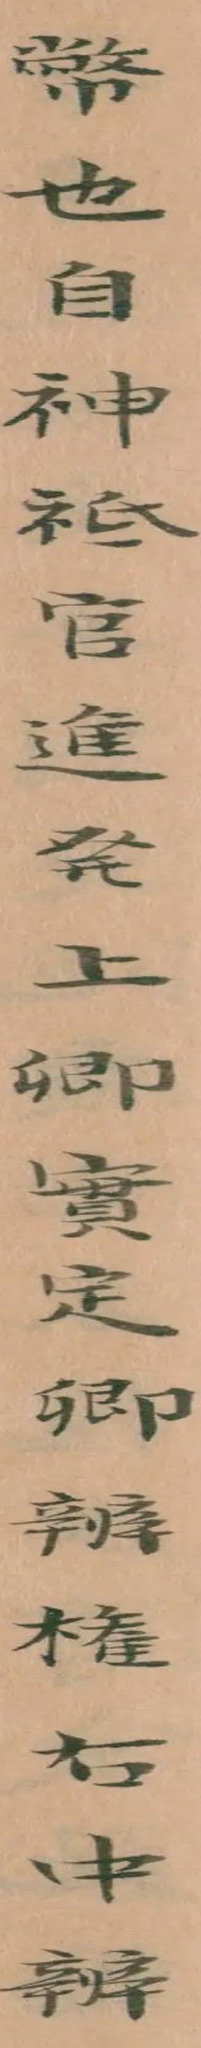幣也自神祗官進発上卿実定卿弁権右中弁
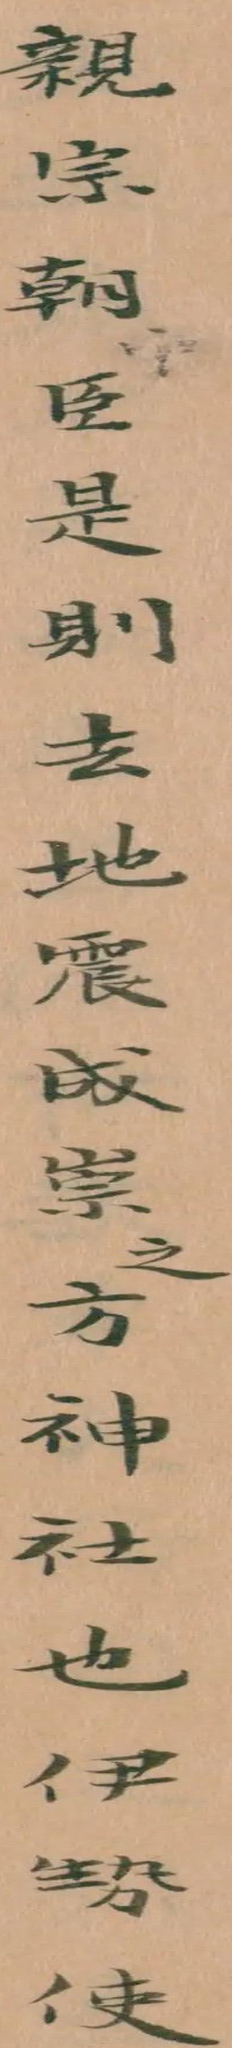親宗朝臣是則去地震成祟之方神社也伊勢使
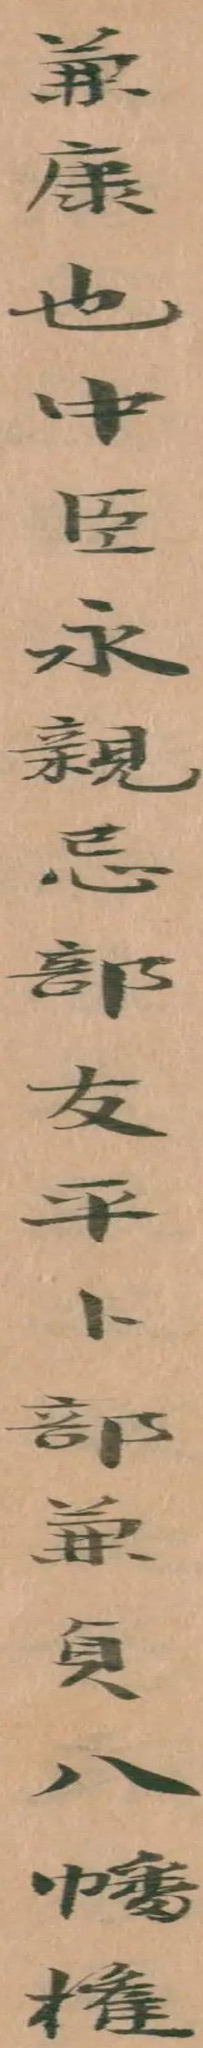兼康也中臣永親忌部友平卜部兼貞八幡権
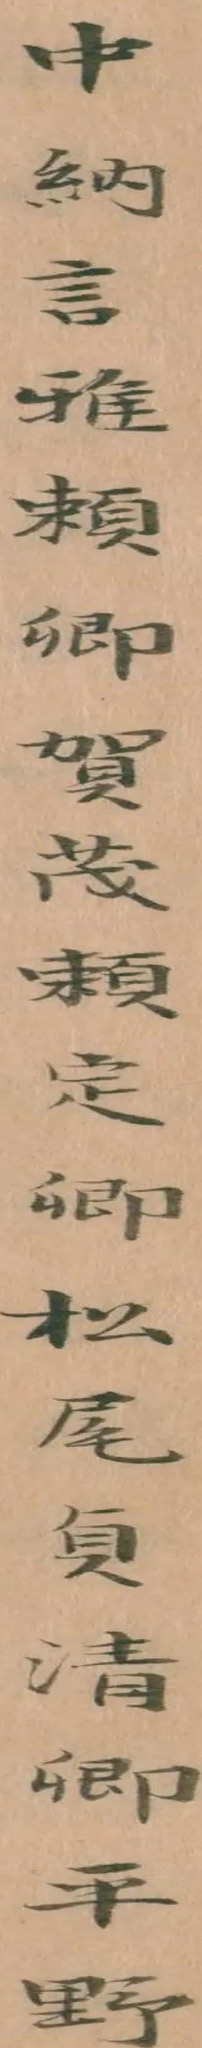中納言雅頼卿賀茂頼定卿松尾貞清卿平野
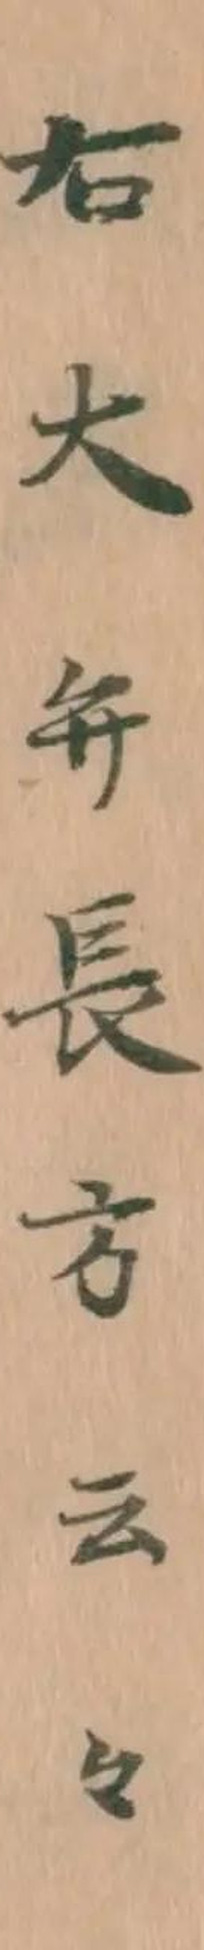右大弁長方云々
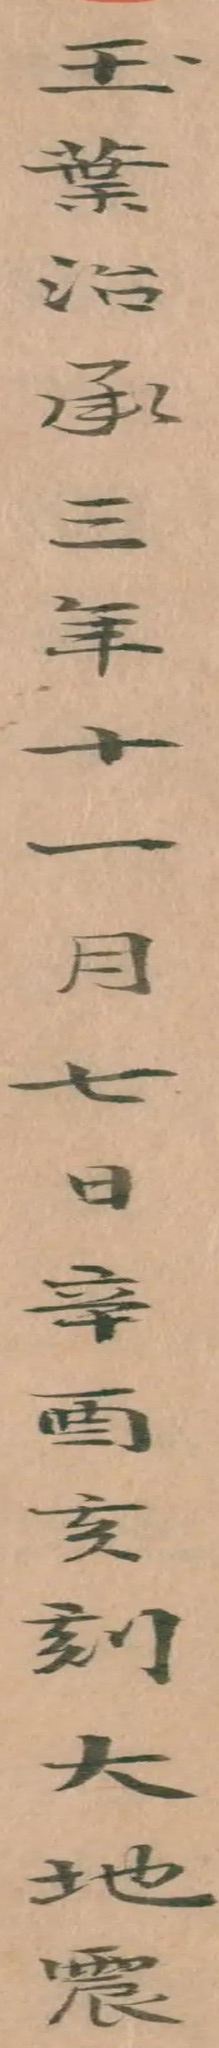○玉葉治承三年十一月七日辛酉亥刻大地震
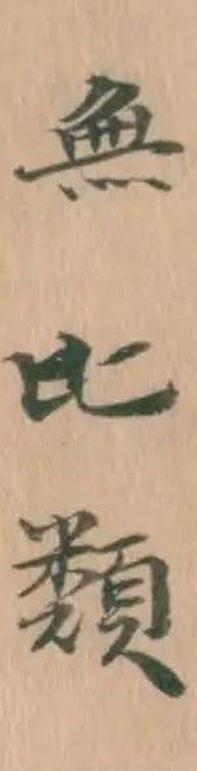無比類
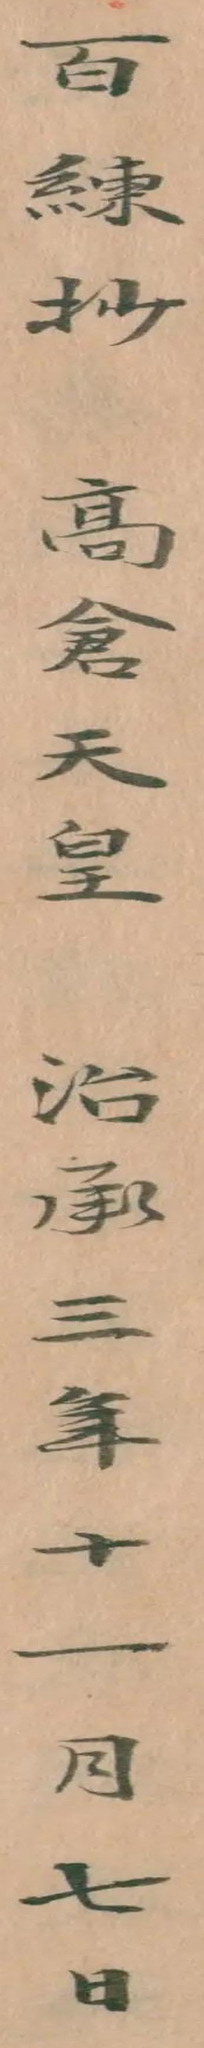○百練抄高倉天皇治承三年十一月七日
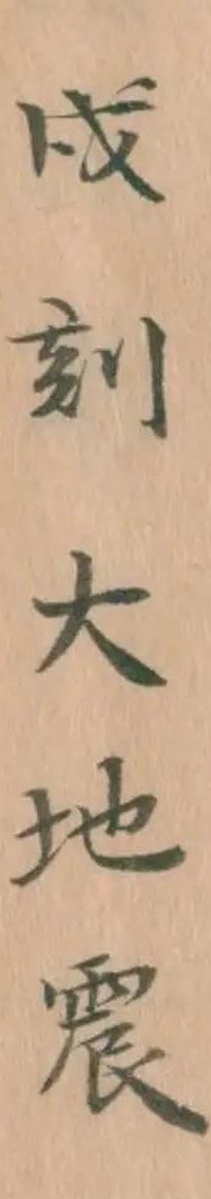戌刻大地震

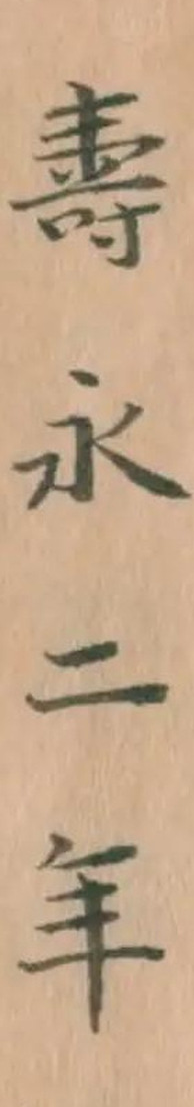寿永二年
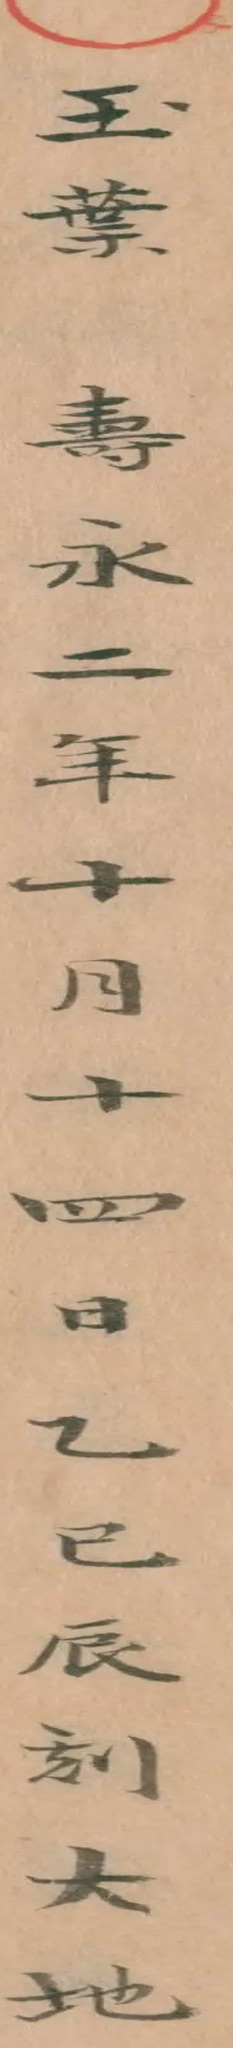○玉葉寿永二年十月十四日乙巳辰刻大地
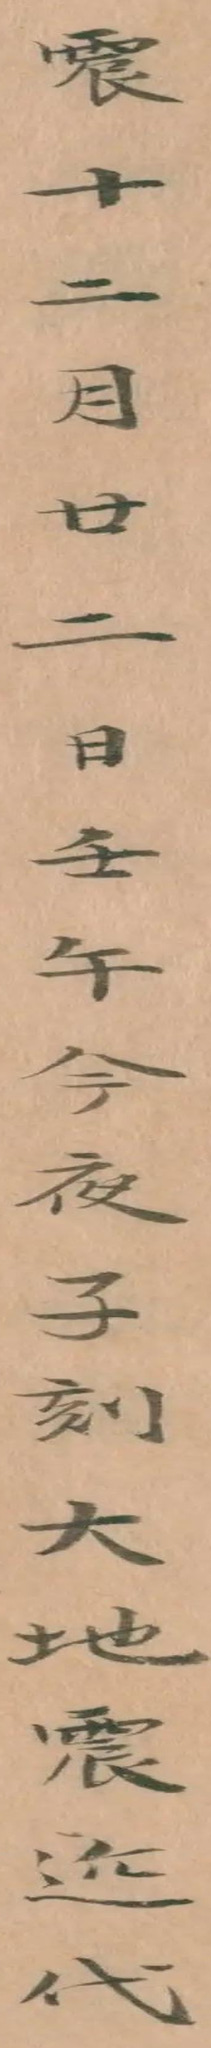震十二月廿二日壬午今夜子刻大地震近代
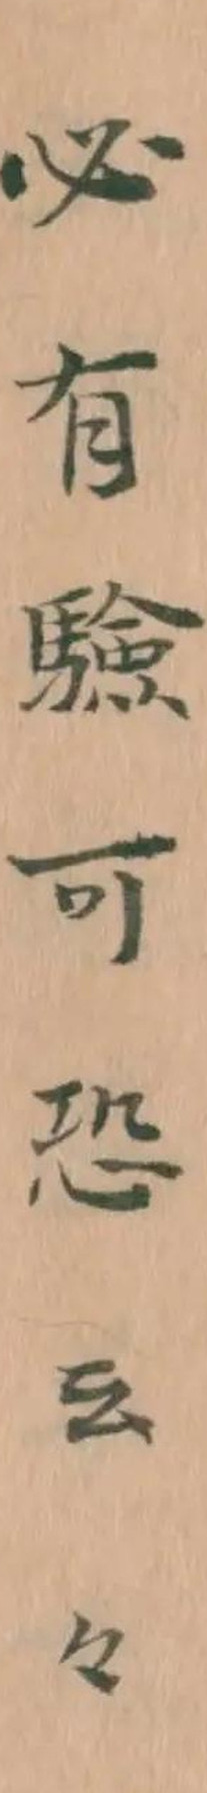必有験可恐云々
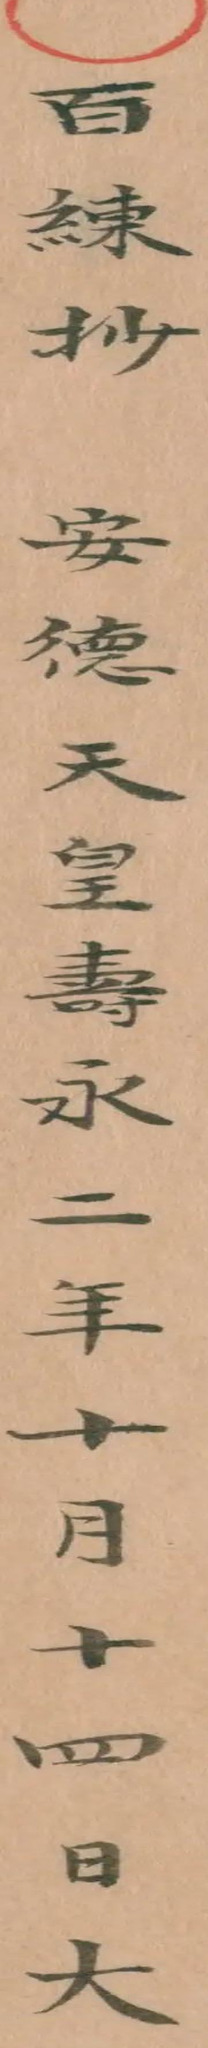○百練抄安徳天皇寿永二年十月十四日大
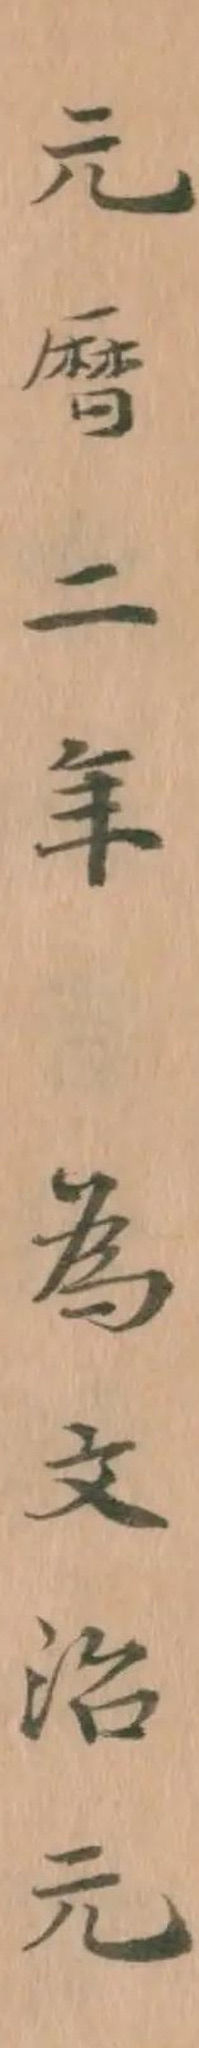元暦二年為文治元
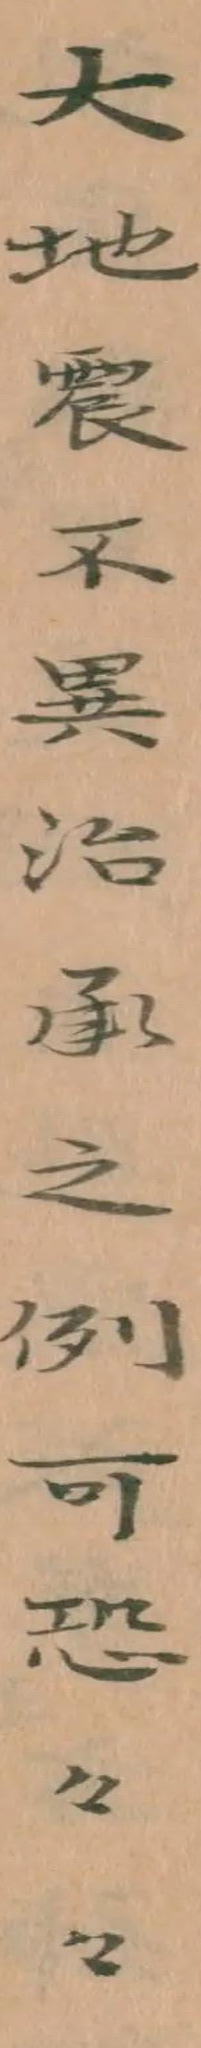大地震不異治承之例可恐々々
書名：地災撮要. 巻5-6(地震之部)
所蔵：国立国会図書館 National Diet Library, JAPAN
